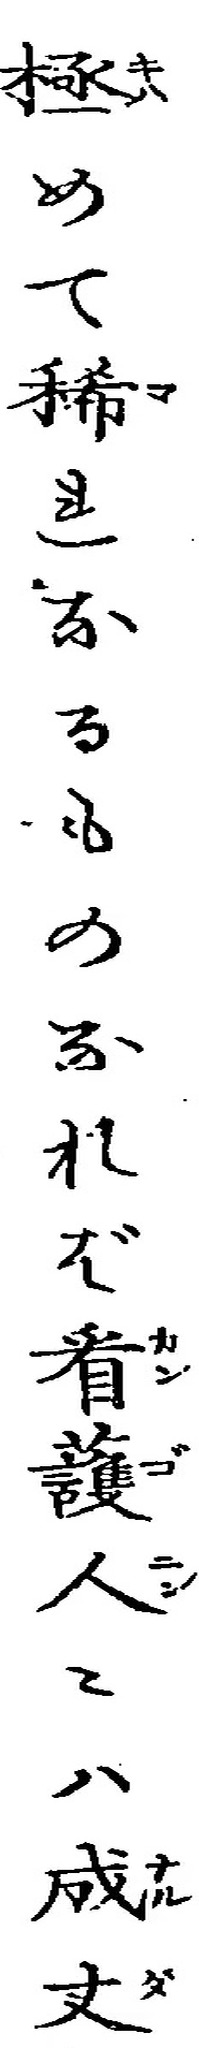極めて稀れなるものなれば看護人には成丈
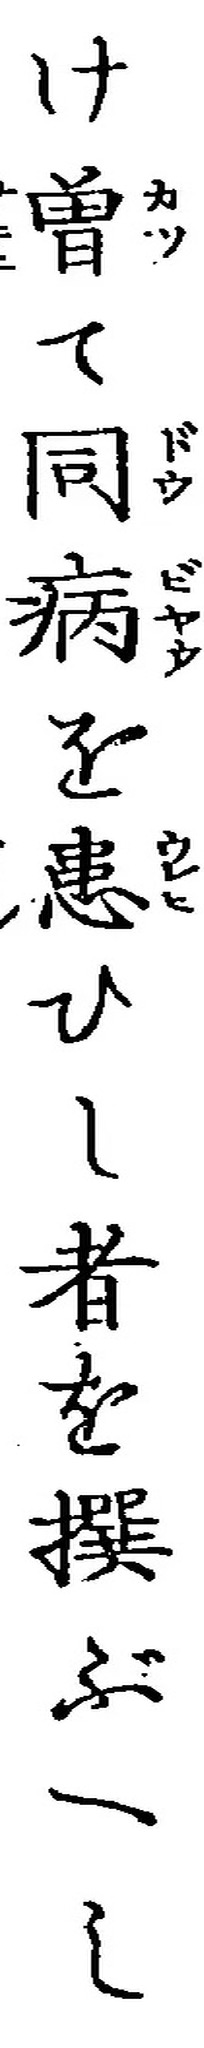け曾て同病を患ひし者を撰ぶへし
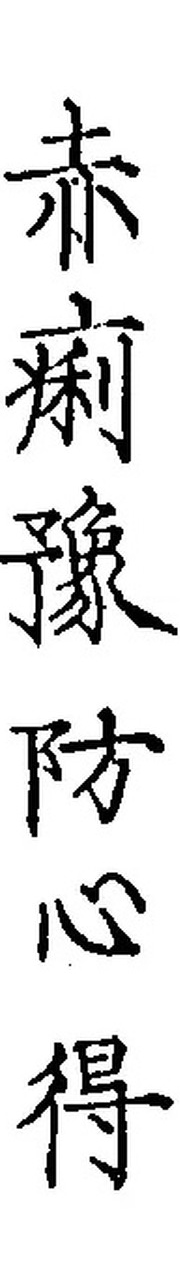赤痢予防心得
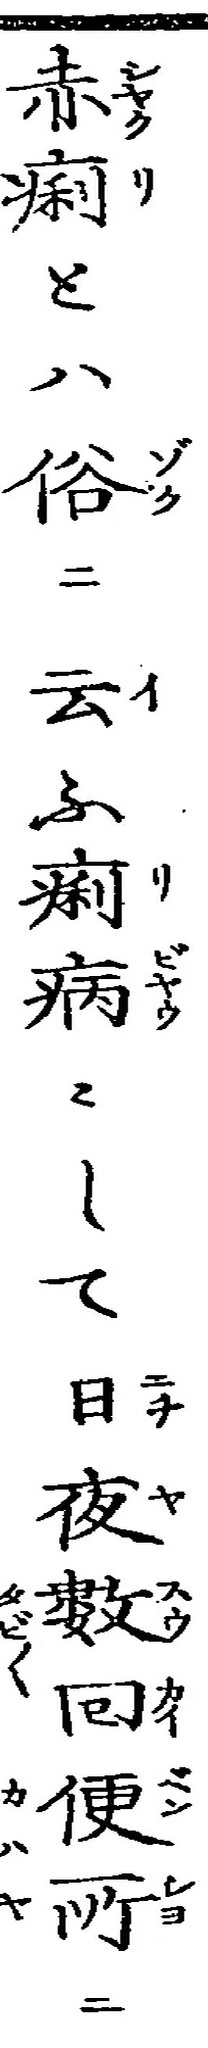赤痢とは俗に云ふ痢病にして日夜数回便所に
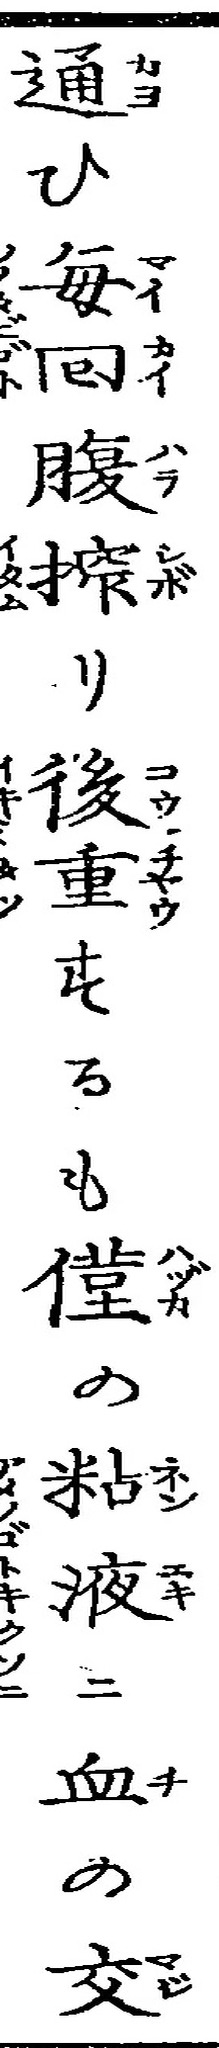通ひ毎回腹搾り後重するも僅の粘液に血の交
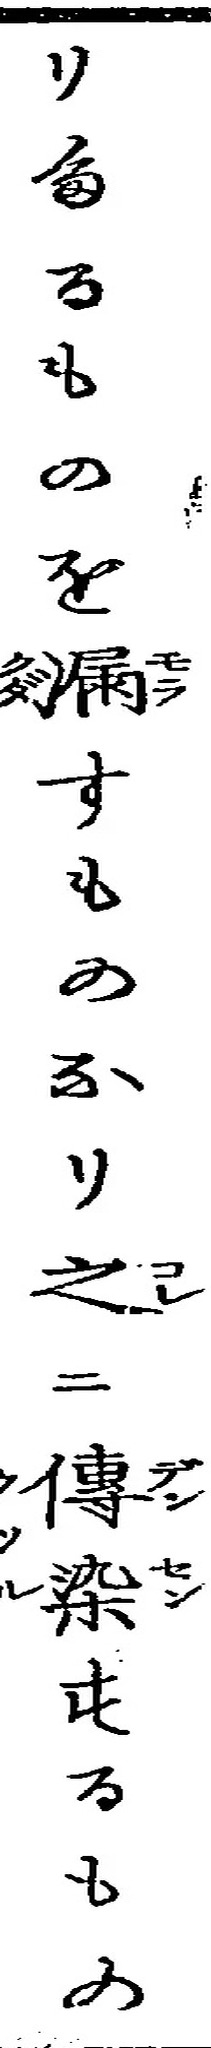りたるものを漏すものなり之に伝染するもの

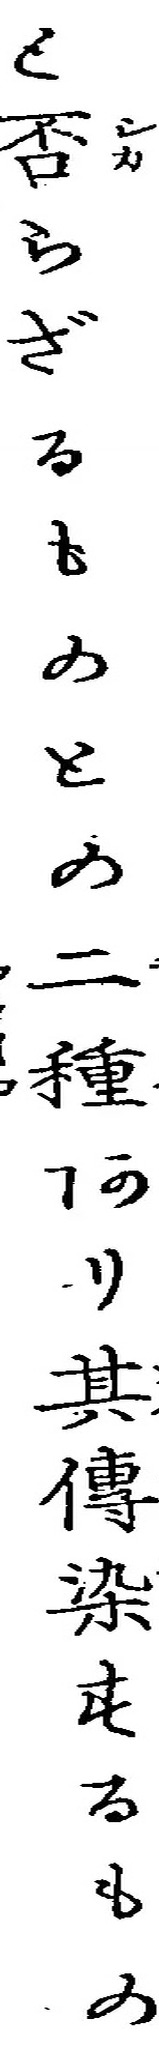と否らざるものとの二種なり其伝染するもの
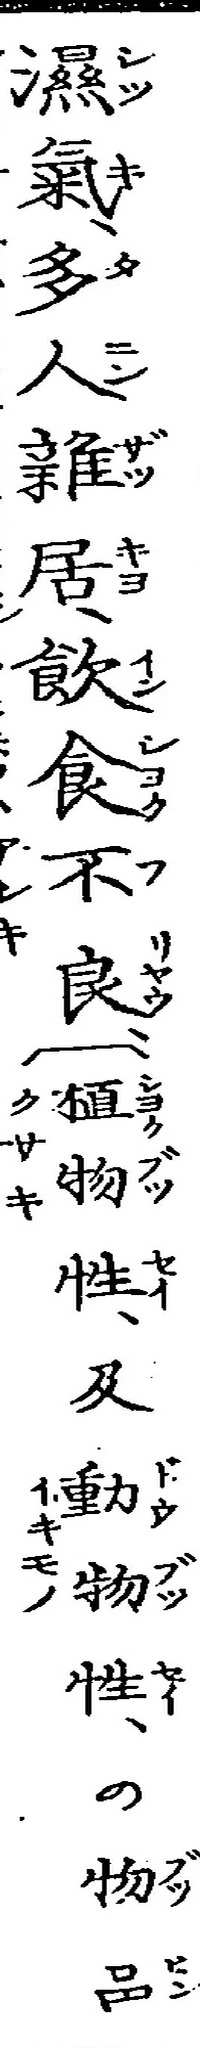湿気、多人雑居、飲食不良、[植物性、及動物性、の物品
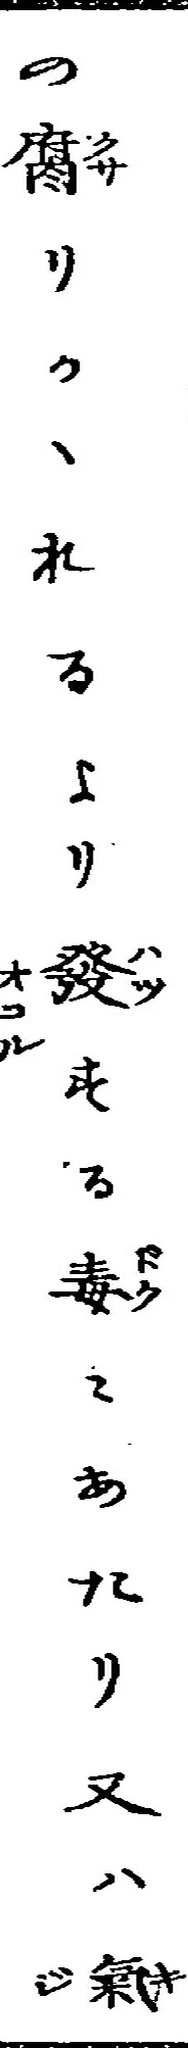の腐りかゝれるより発する毒にあたり又は気
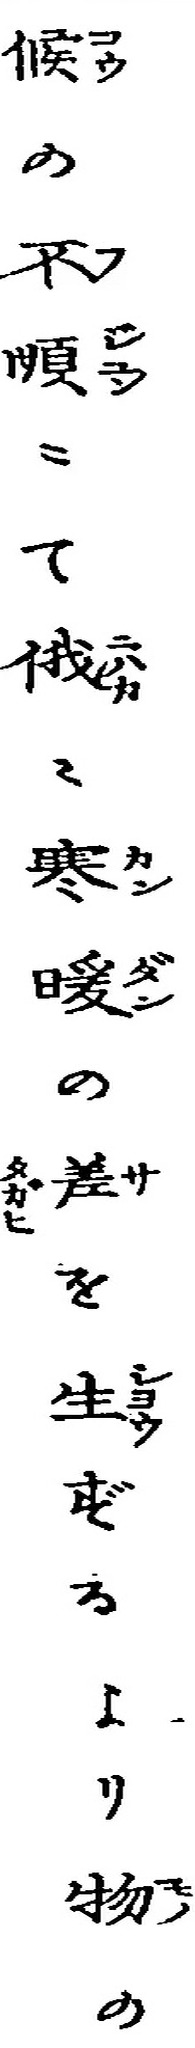候の不順にて俄に寒暖の差を生ずるより物の
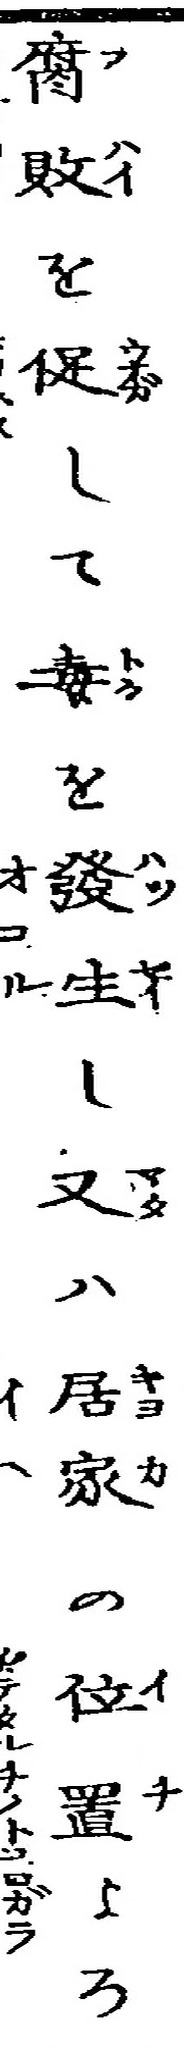腐敗を促して毒を発生し又は居家の位置よろ
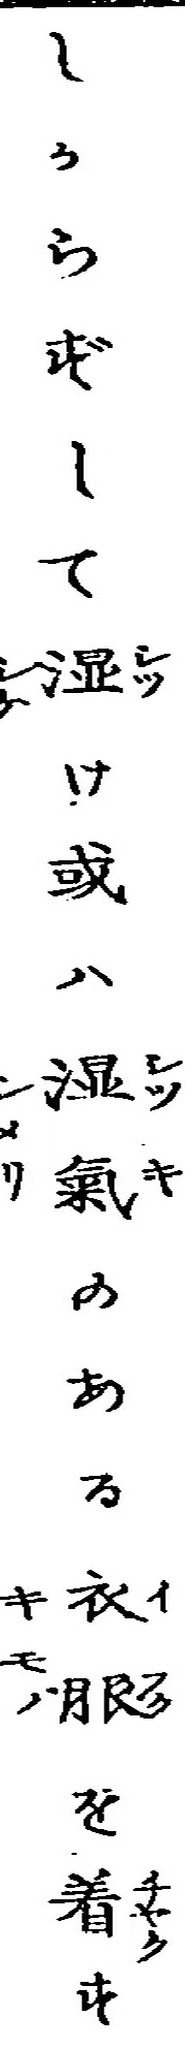しからずして湿け或は湿気のある衣服を着す
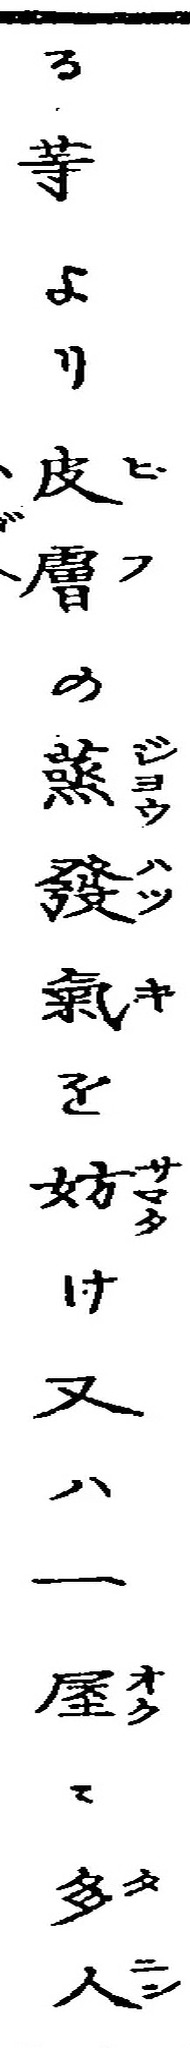る等より皮膚の蒸発気を妨け又は一屋に多人
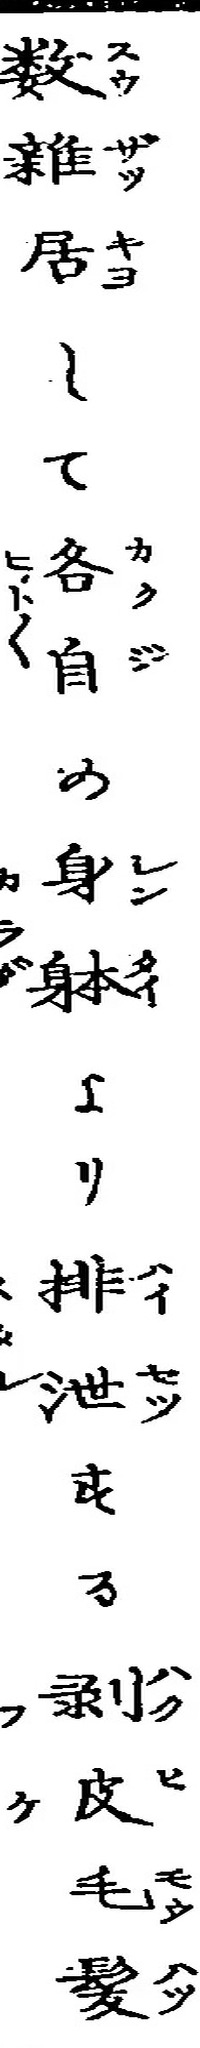数雑居して各自の身体より排泄する剥皮毛髪
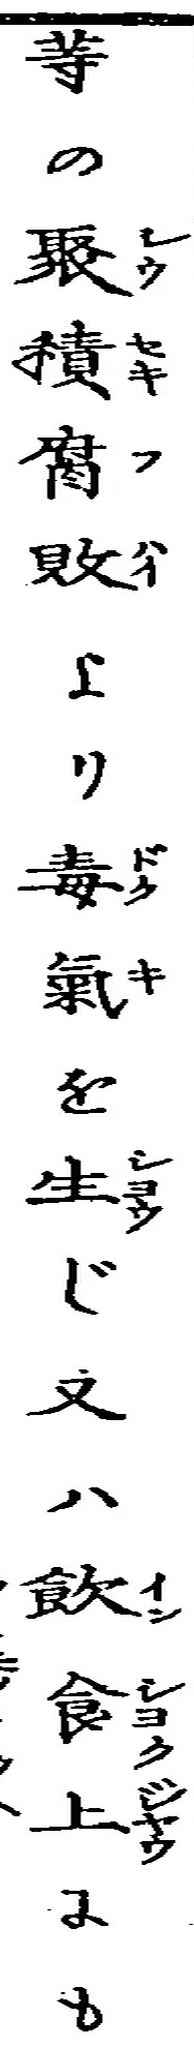等の聚積腐敗より毒気を生じ又は飲食上にも
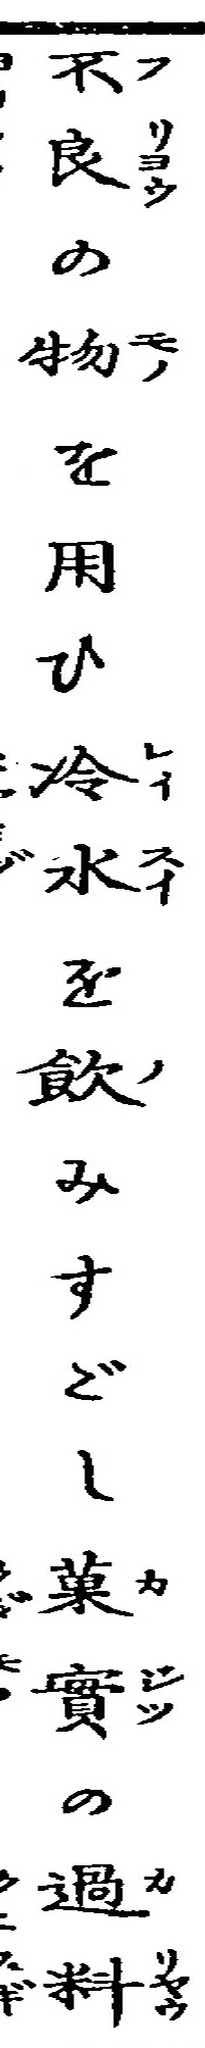不良の物を用ひ冷水を飲みすごし菓実の過料
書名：伝染病予防法
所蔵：国立国会図書館 National Diet Library, JAPAN
